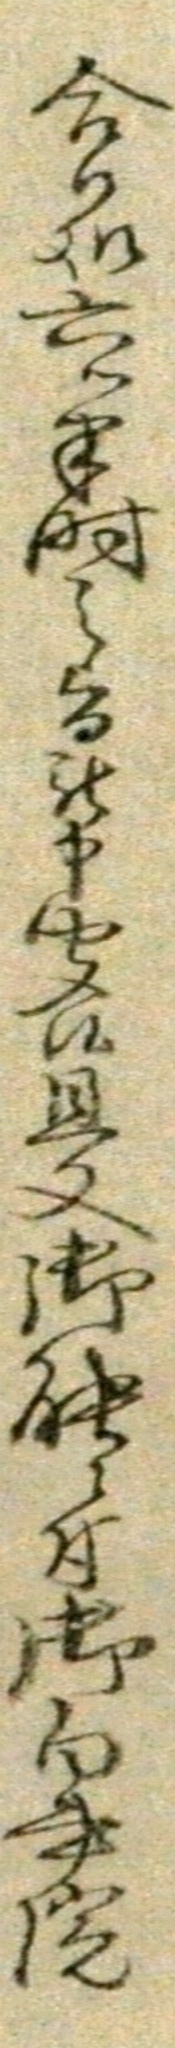合候処六ツ半時之旨被申聞候且又御能ニ付御白書院
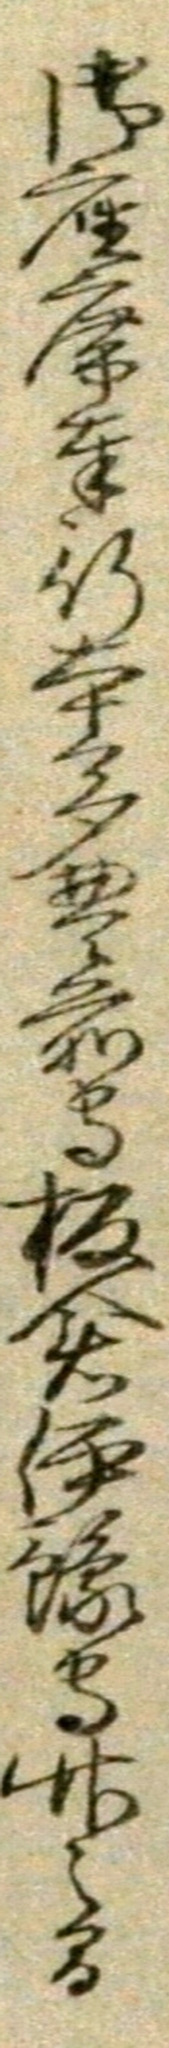御座席奉行本多豊前守板倉伊予守竹之間
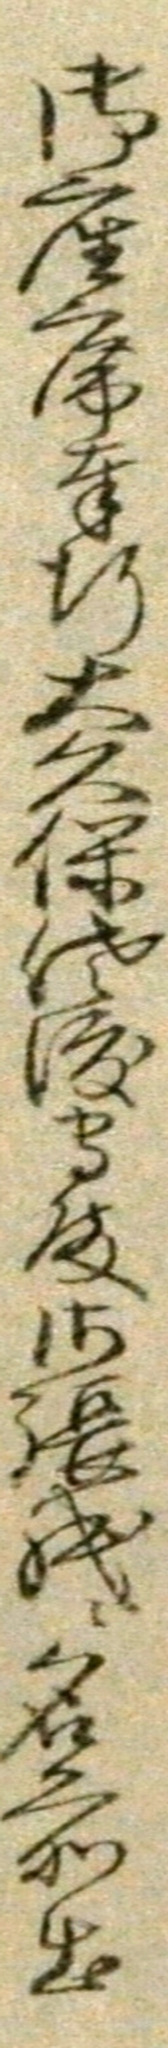御座席奉行大久保佐渡守殿御張紙ニ名前出
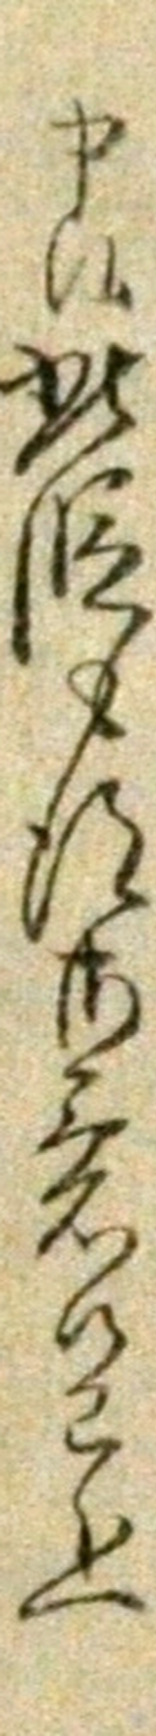申候此段も得御意候已上
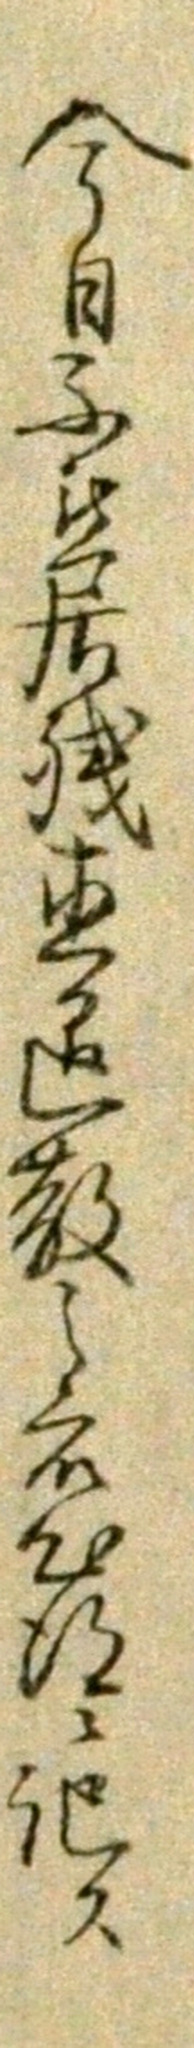今日不被居残直退散之衆心得ニ記ス
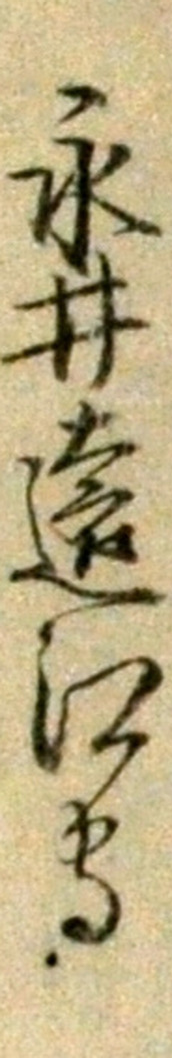永井遠江守
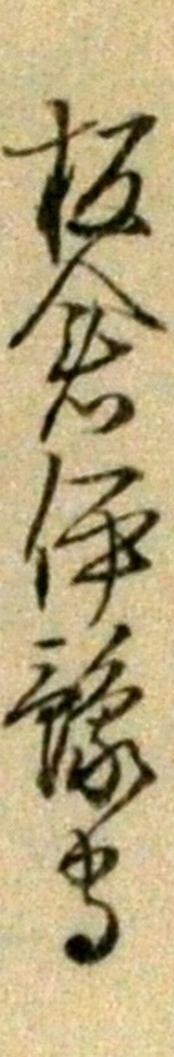板倉伊予守
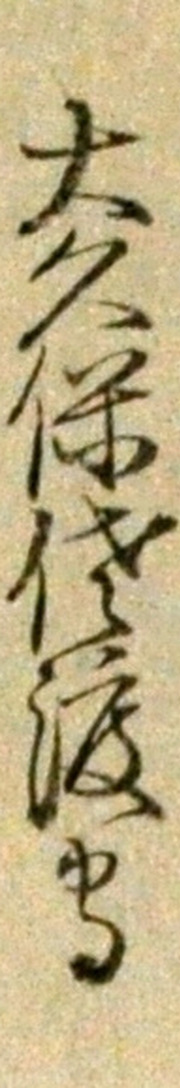大久保佐渡守
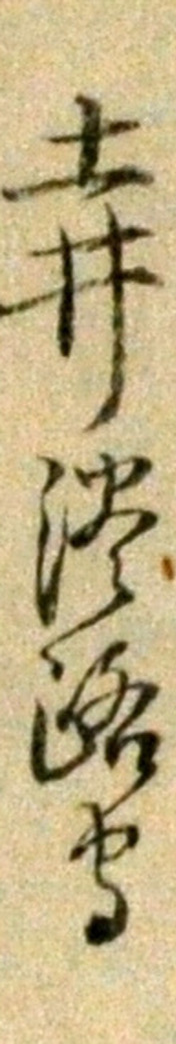土井淡路守
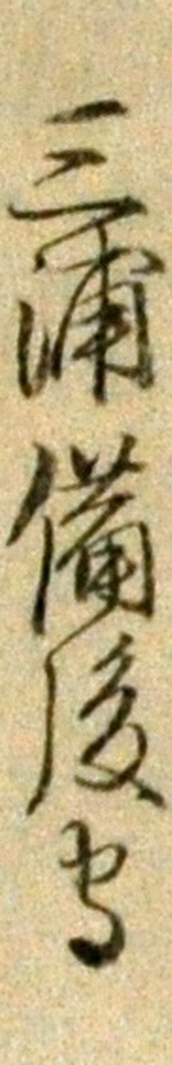三浦備後守
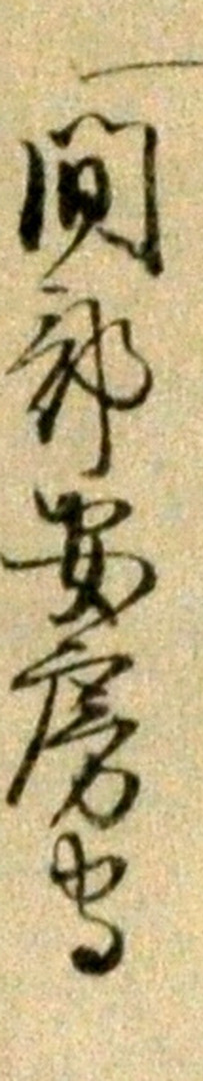間部安房守
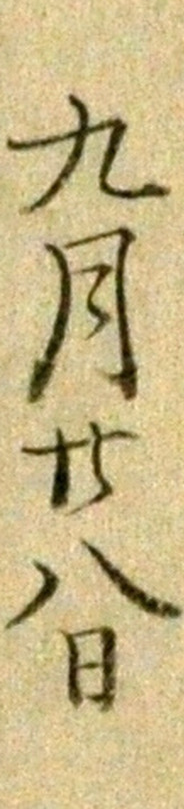九月廿八日
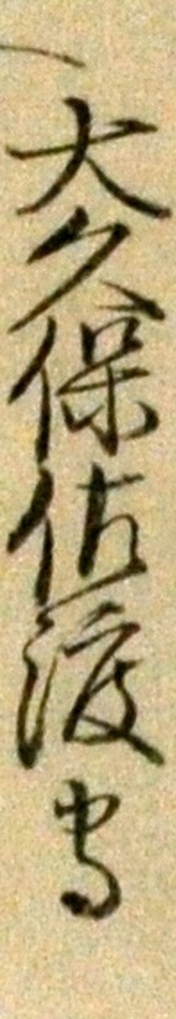大久保佐渡守
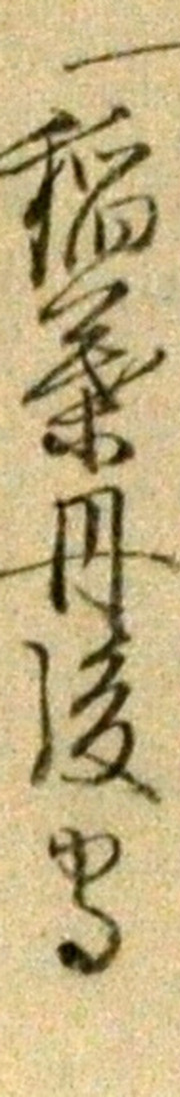稲葉丹後守
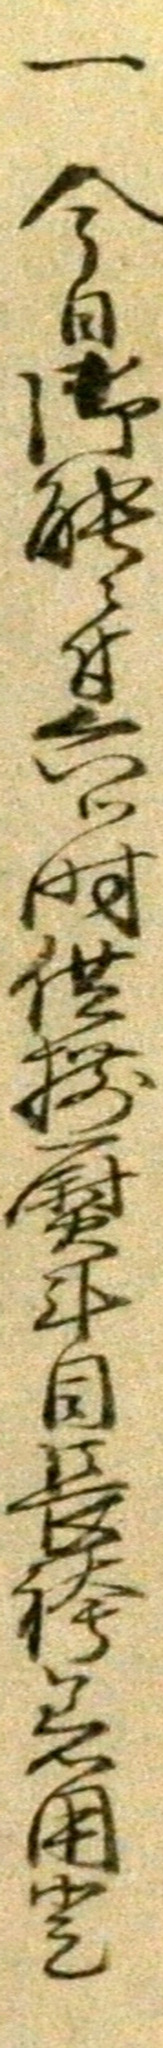一今日御能ニ付六ツ時供揃熨斗目長袴着用登
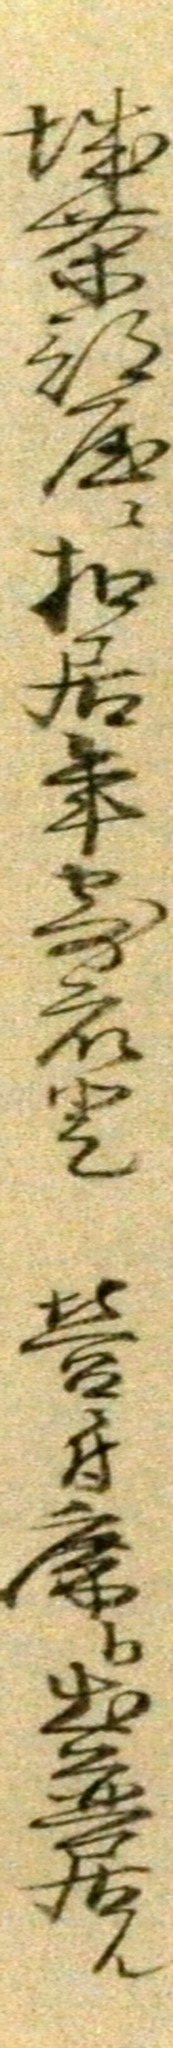城茶部屋ニ扣居年寄衆登営ニ付席え出並居候
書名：諸留書〔一括〕
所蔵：伊那市立高遠町図書館・合同会社AMANE
